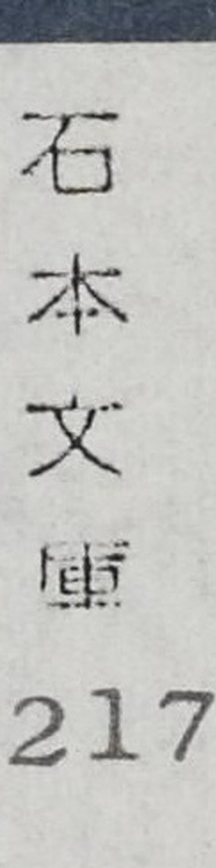石本文庫
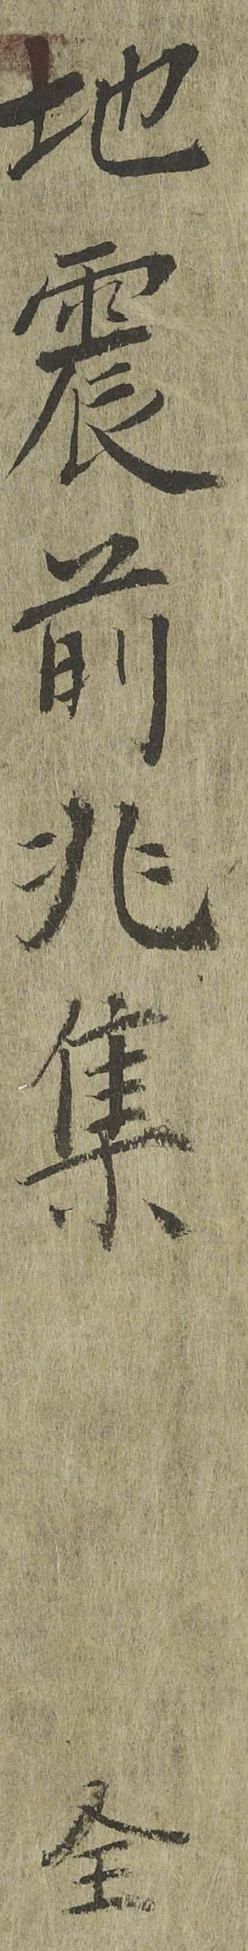地震前兆集全

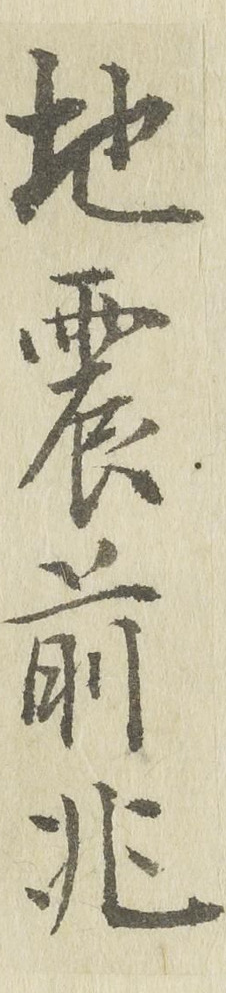地震前兆

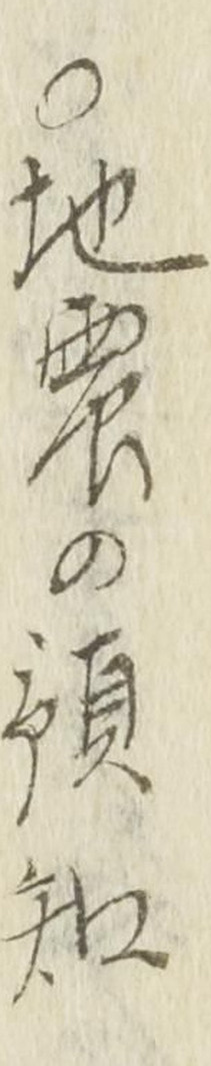◯地震の預知

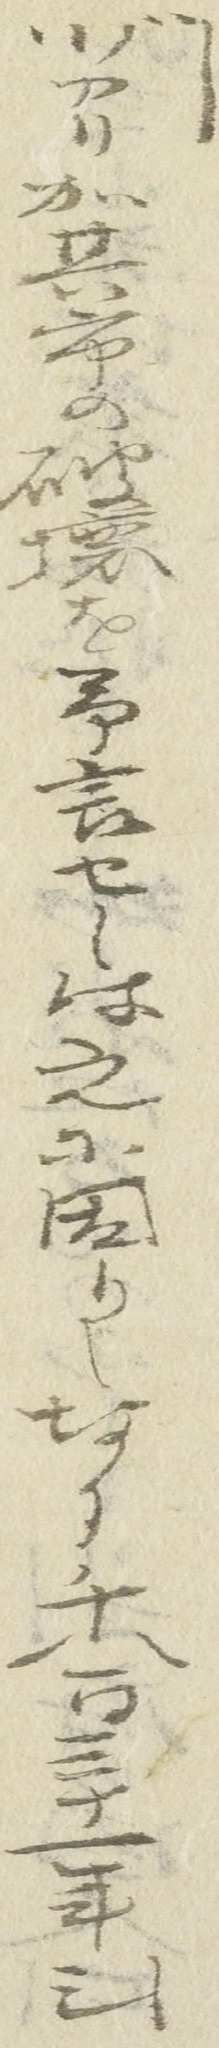ヅアリが其市の破壊を予言せしは之に因りしなり千八百三十一年シ
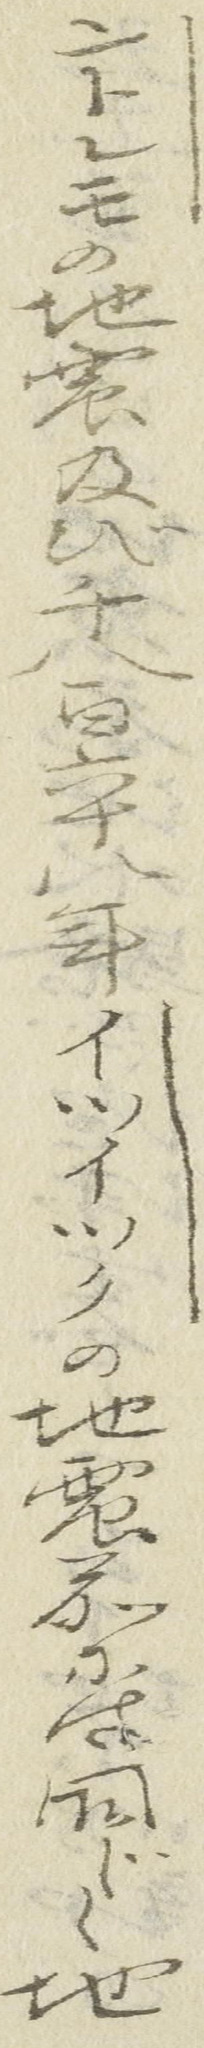ントレモの地震及び千八百六十八年イツイツクの地震前には同じく地
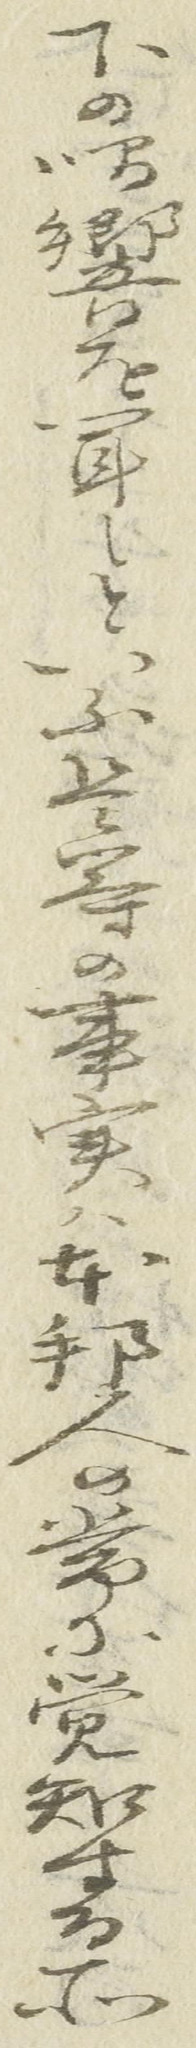下の鳴響を聞しといふ其等の事実は本邦人の常に覚知する所
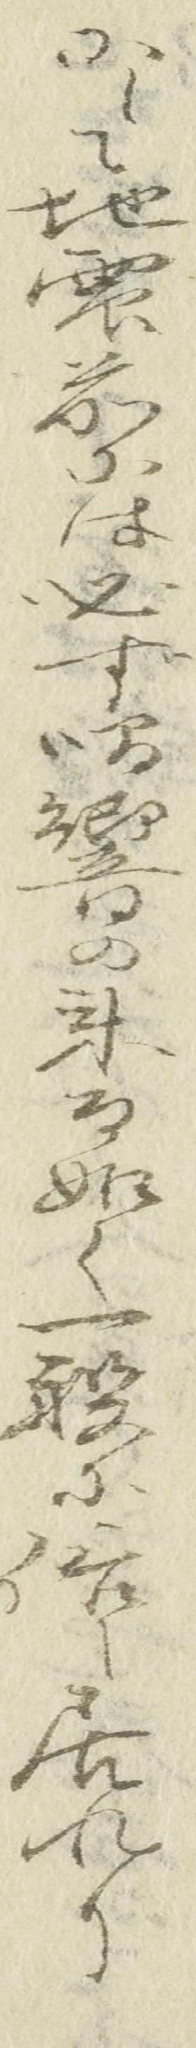にして地震前には必ず鳴響の来る如く一般に信し居れり
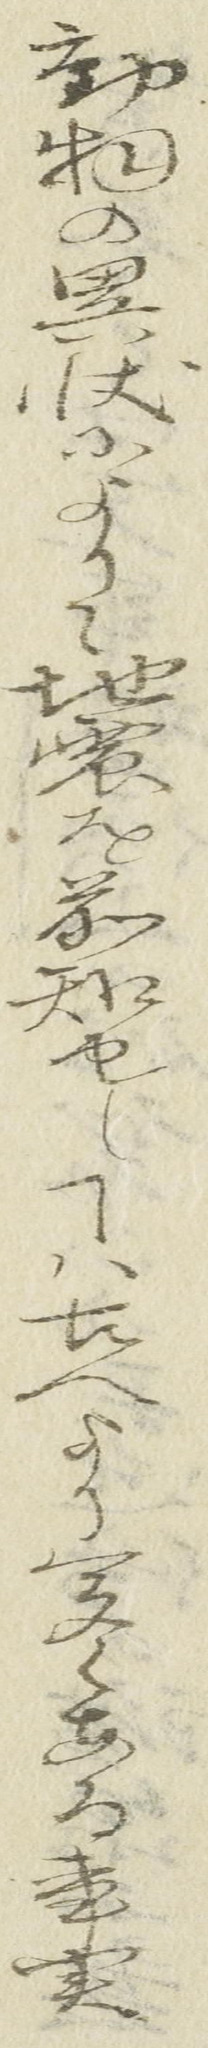一動物の異状によりて地震を前知せしコトは古へより多くある事実
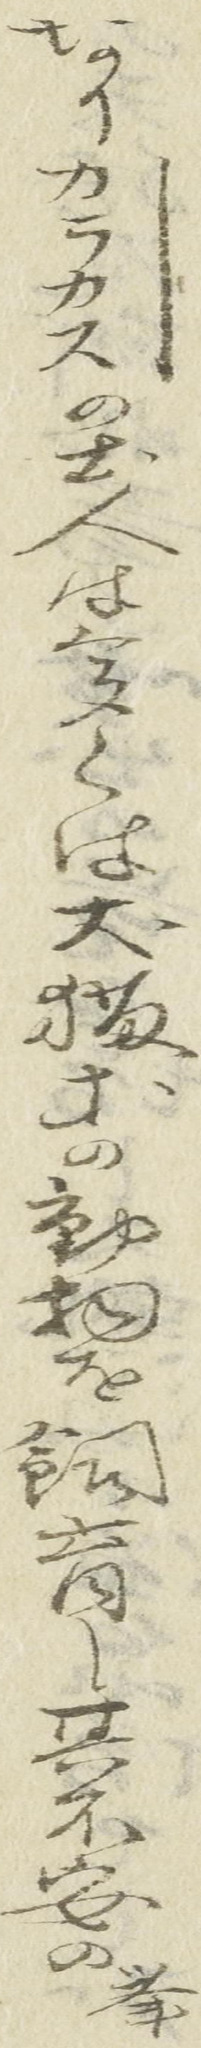なりカラカスの土人は多くは犬猫等の動物を飼育し其不安の挙
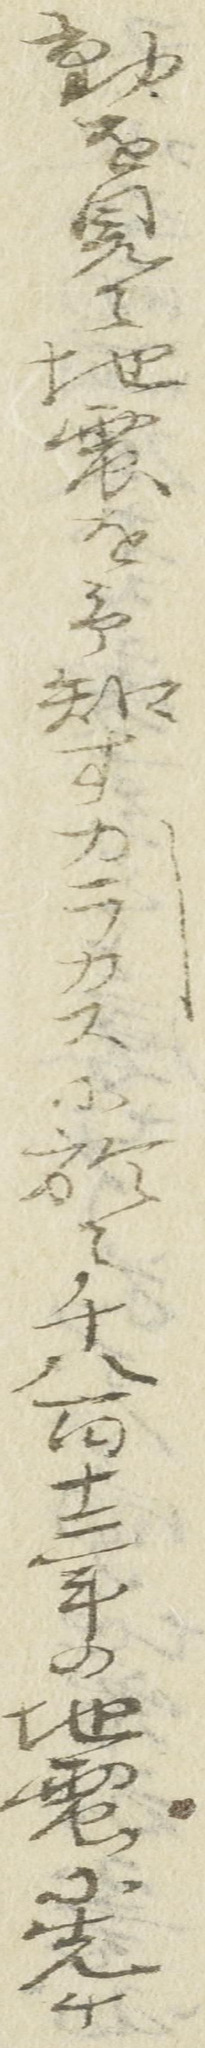動を見て地震を予知すカラカスに於て千八百十三年の地震に先ケ
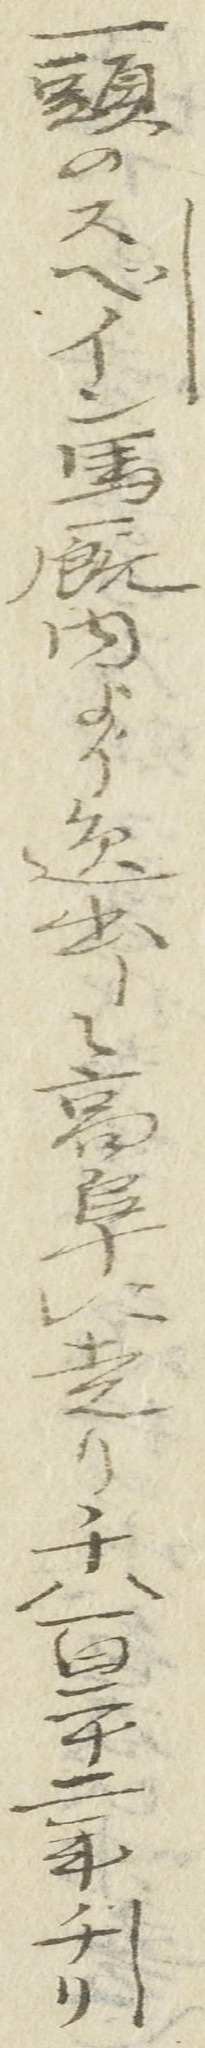一頭のスペイン馬厩内より逸出して高阜に走り千八百二十二年チリ
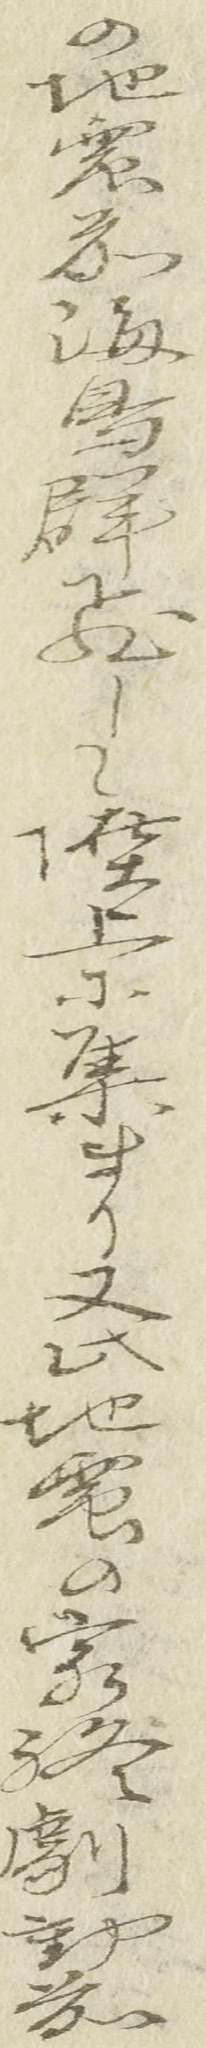の地震前海鳥群飛して陸上に集まり又此地震の最終劇動前
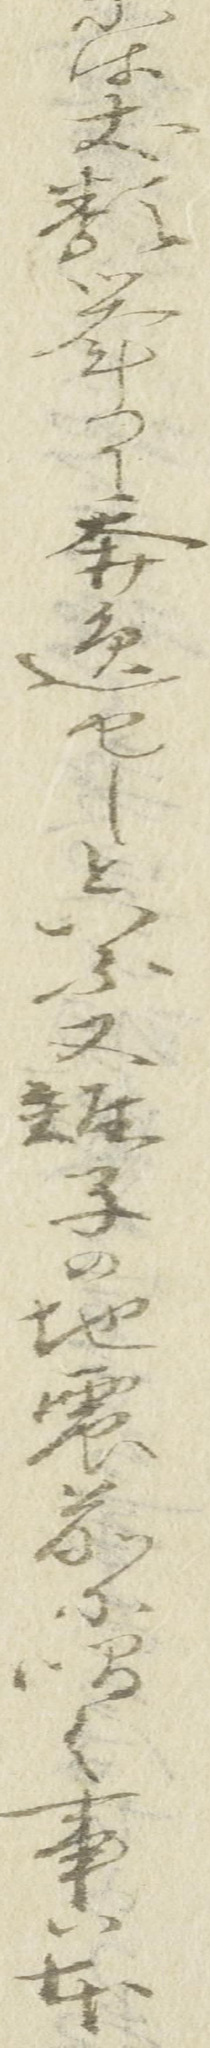には犬類挙つて奔逸せしという又雉子の地震前に鳴く事は本
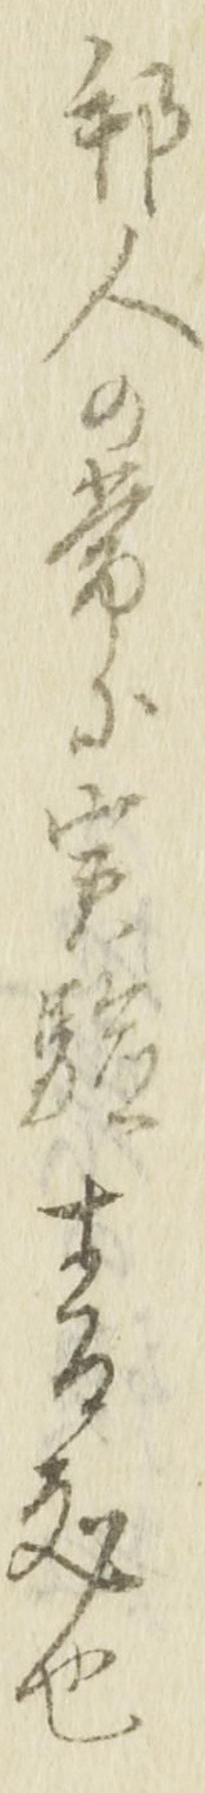邦人の常に実験する処也
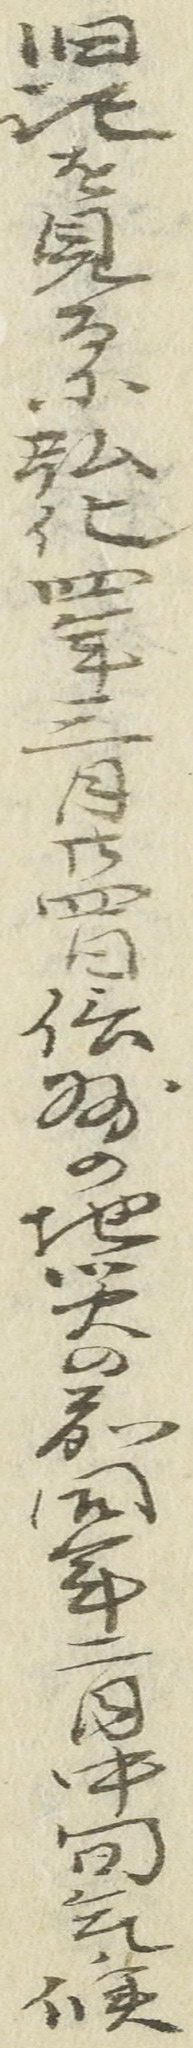一旧記を見るに弘化四年三月廿四日信州の地災の前同年二月中旬気候
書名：地震前兆集　全
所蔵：東京大学地震研究所図書室 Earthquake Research Institute Library, The University of Tokyo, JAPAN
